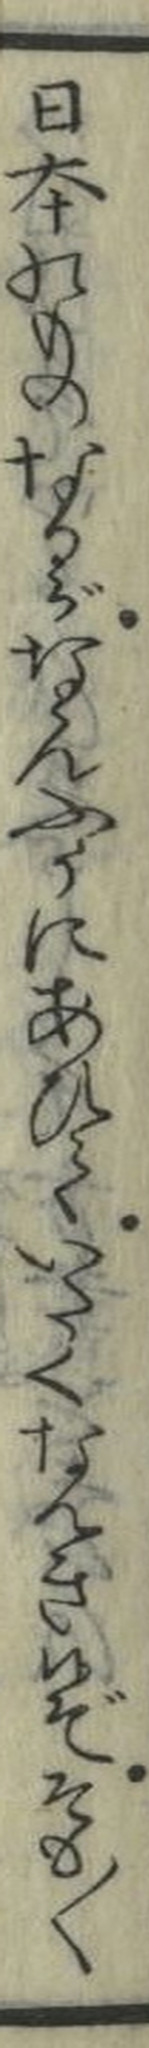日本のものなるが・なんふうにあひて・いたくなんぎ候ぞ・そも〳〵
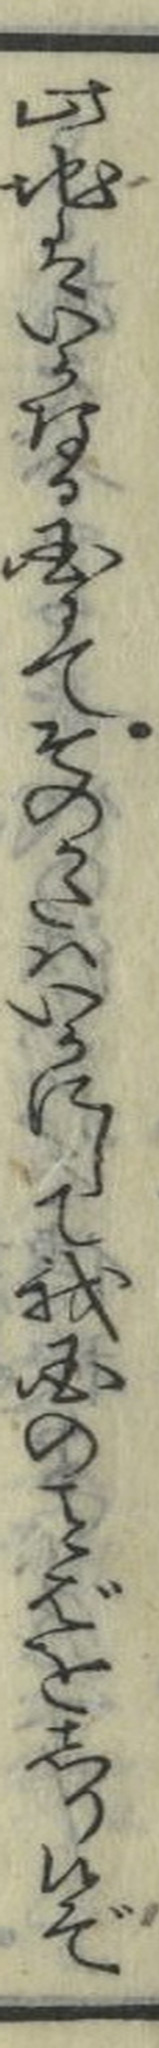此地はいかなる国にて・そのかたはいうにして我国のことばをしり候ぞ
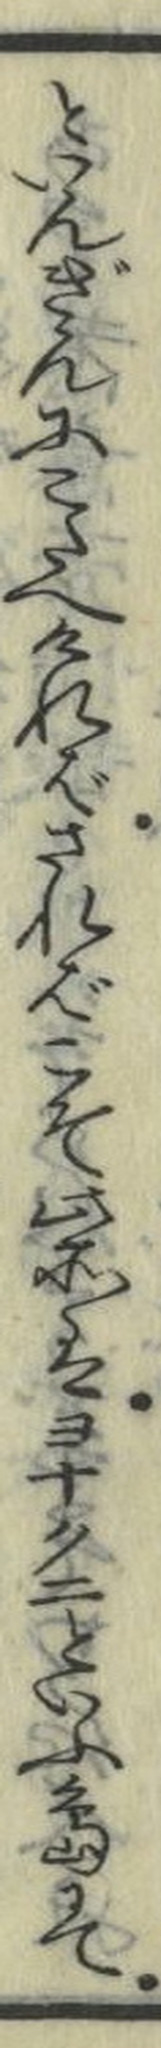といんぎんにこたへければ・さればこそ此所は・ヨナクニといふ島にて・
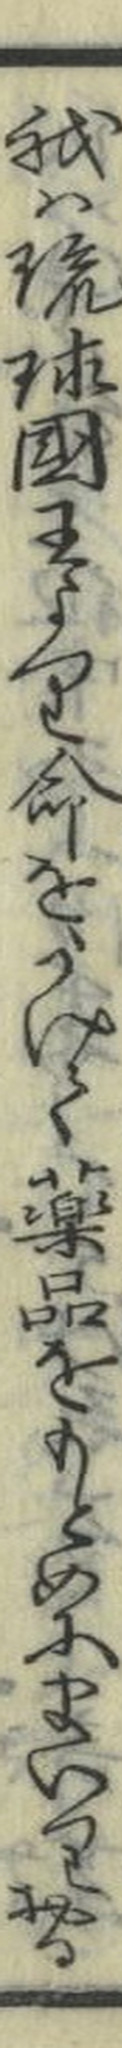我は琉球國王より命をうけて・薬品をもとめにまいりおる
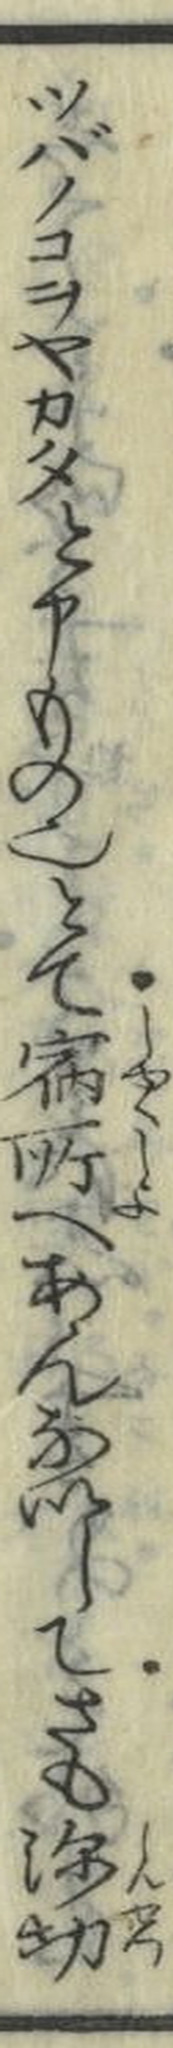ツバノコヲヤカタと申もの也とて・宿所へあんないして・さも深切
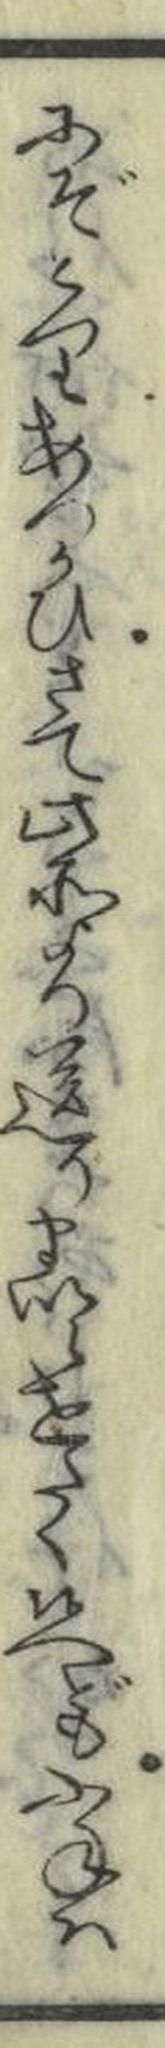にぞとりあつかひ・さて此所より送り参らせたく候へども・ふねは
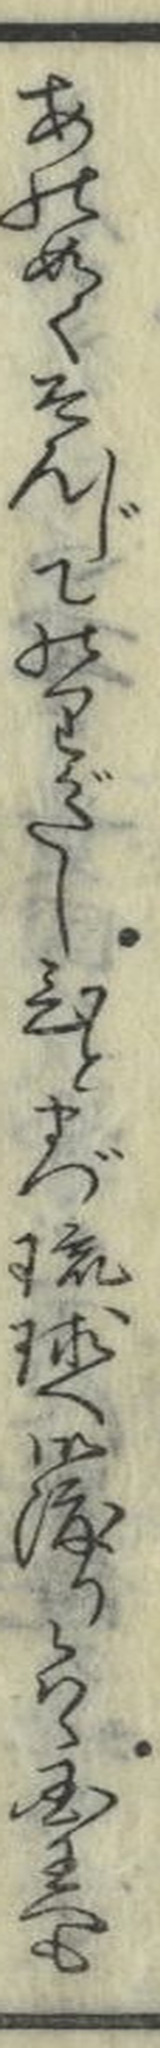あの如くそんじてのりがたし・ひとまづ琉球へ御渡り候はゝ・国王へも
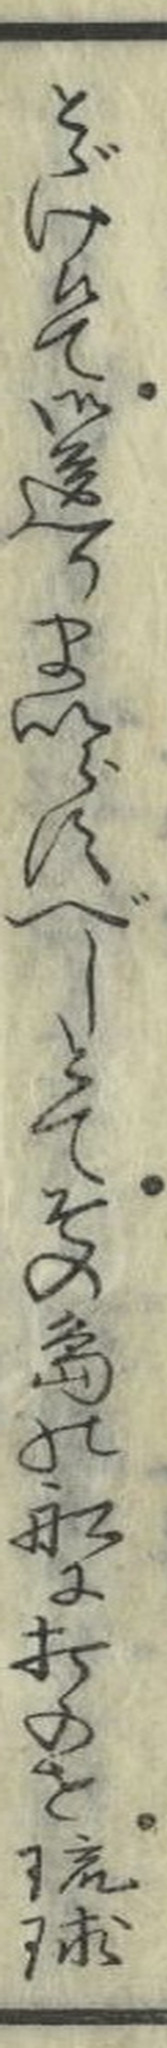とゞけ候て・御送りまいらすべしとて・その島の船に打のせ・琉球
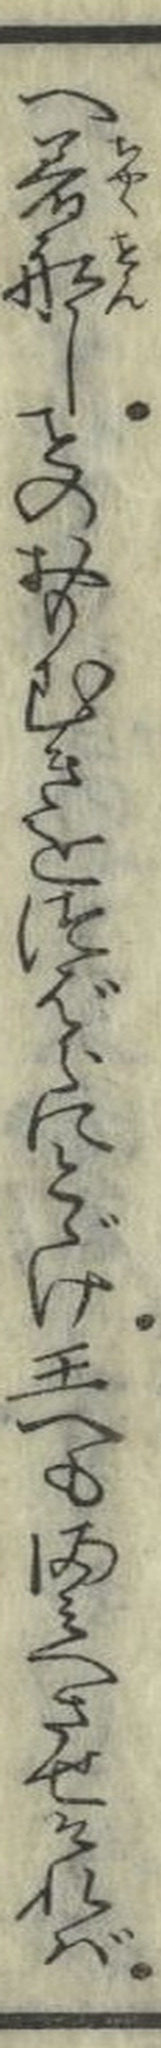へ着船し・ことのおもむきをつばらにとゞけ・王へもまみへさせければ・
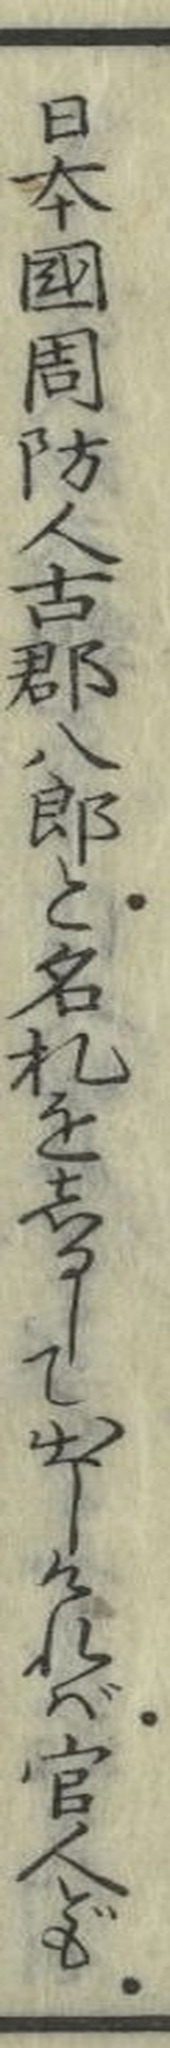日本周防人古郡八郎と・名札をしるして出しければ・官人ども・

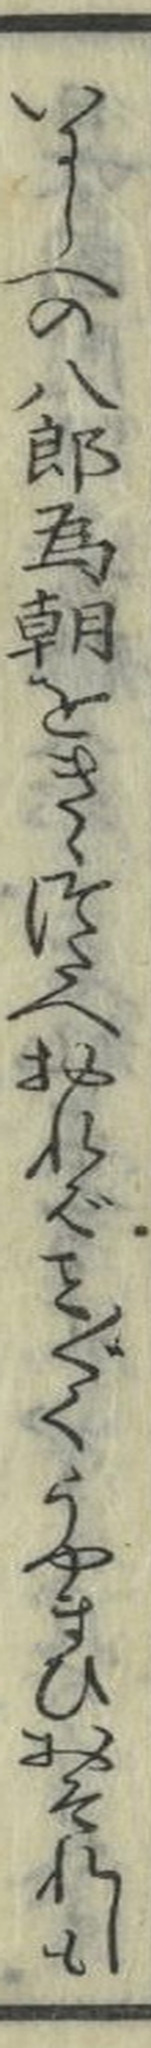いにしへの八郎爲朝ときゝつたへおれば・こと〴〵くうやまひおそれしも
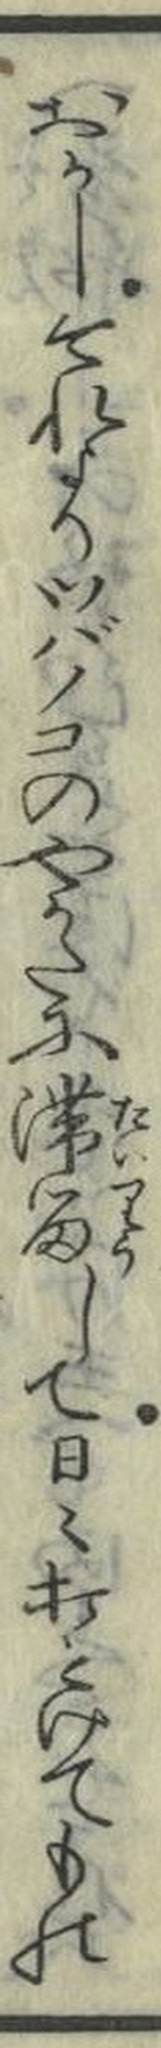おかし・それよりツバノコのやかたに滞留して・日々打とけてもの
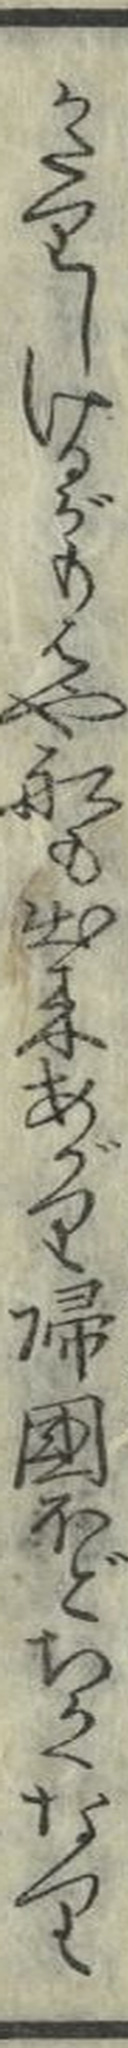かたりしけるが・もはや船も出来あがり・帰國ほどちかくなり
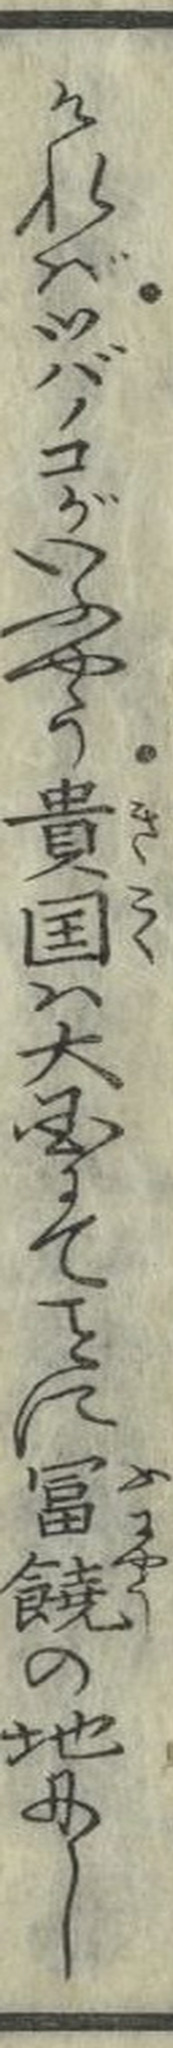ければ・ツバノコがいふやう・貴国は大国にてことに冨饒の地にし
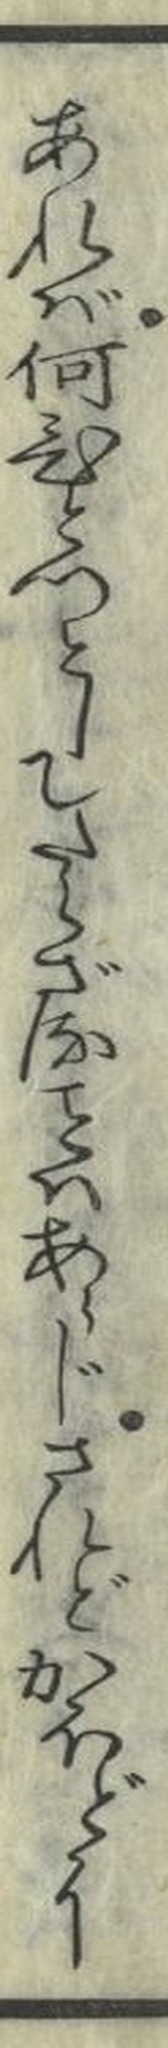あれば・何ひとつとしてたらざることはあらじ・されどかほどに
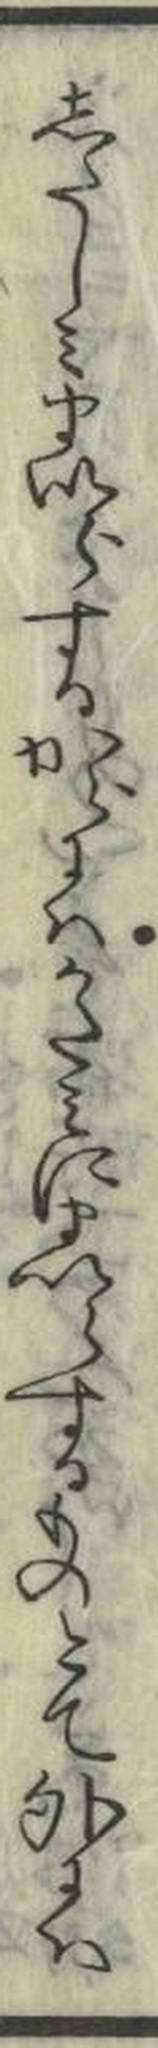したしみまいらするからには・かたみにまいらすものとて外には
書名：琉球秊代記 附雑話 全
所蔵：University of the Ryukyus Library
